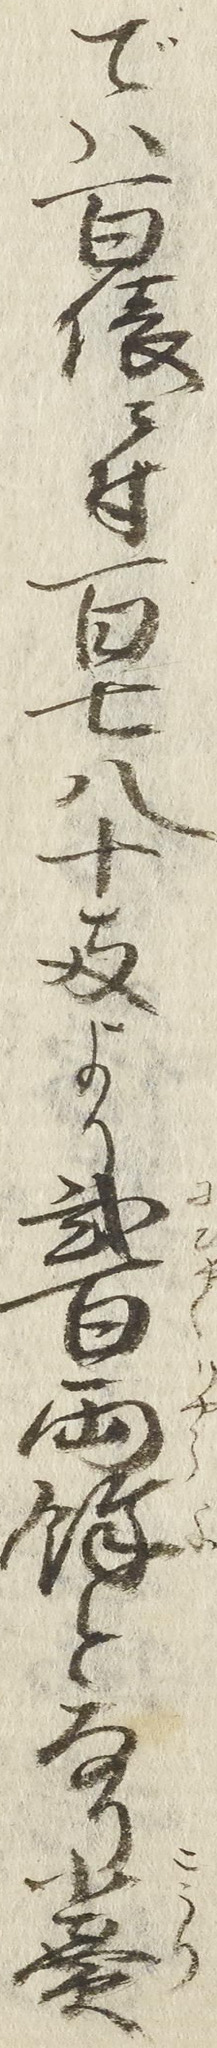では百俵ニ付百七八十両より弐百両余となり小売
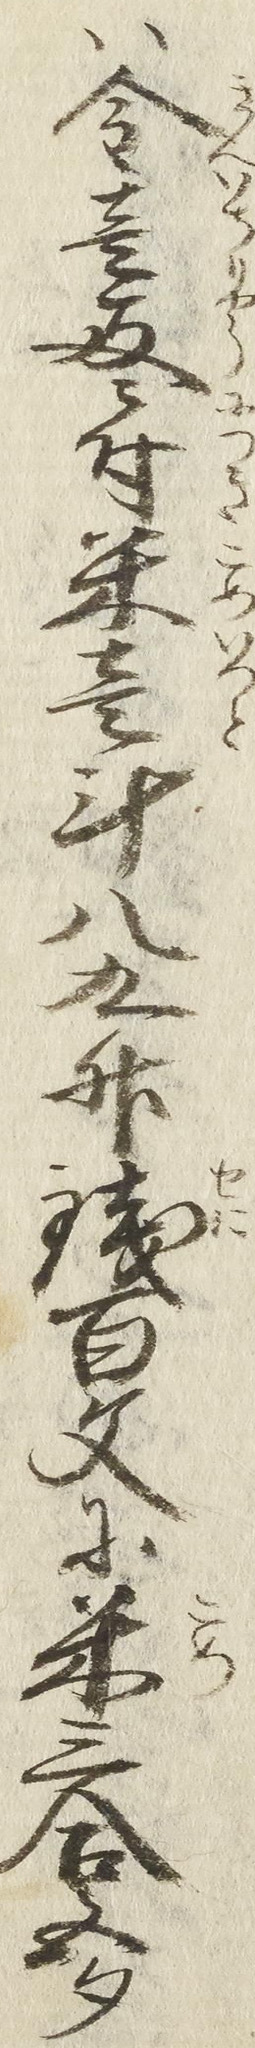は金壱両ニ付米壱斗八九升銭百文に米三合五勺
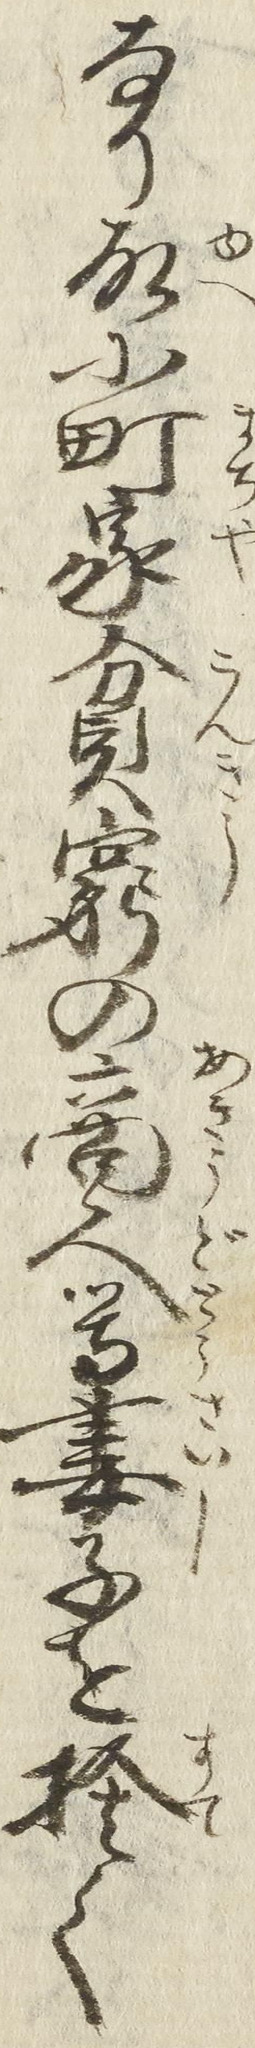なり故に町家貧窮の商人等妻子を捨て
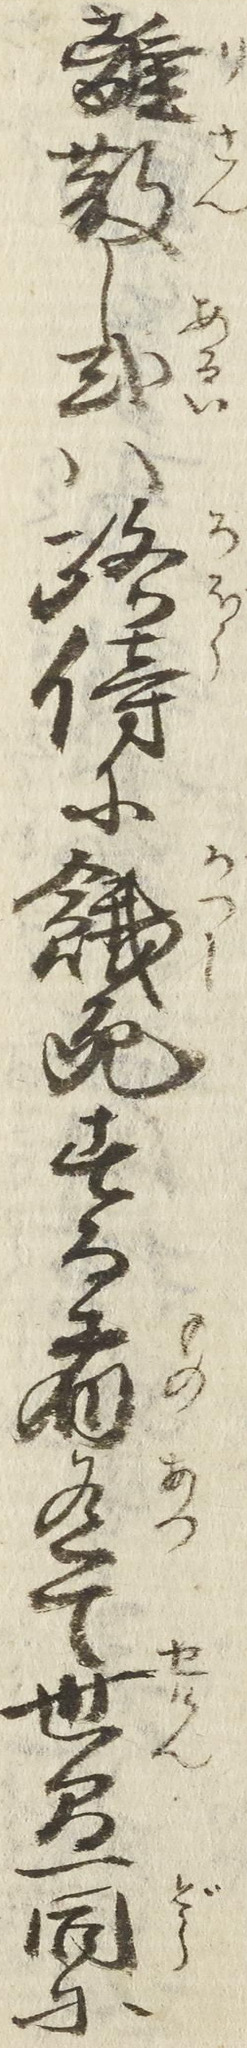離散し或は路傍に餓死する者有て世間一同に
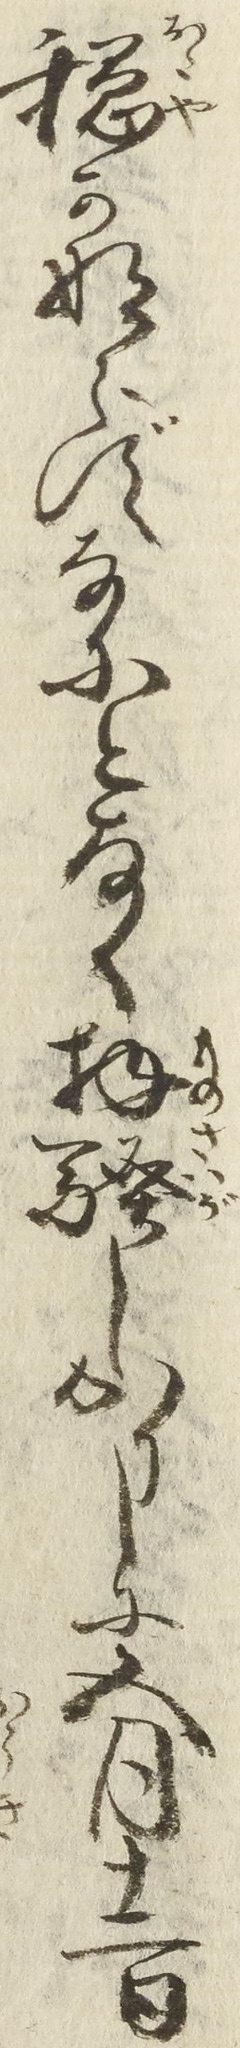穏かならずなにとなく物騒しかりしに五月十二日
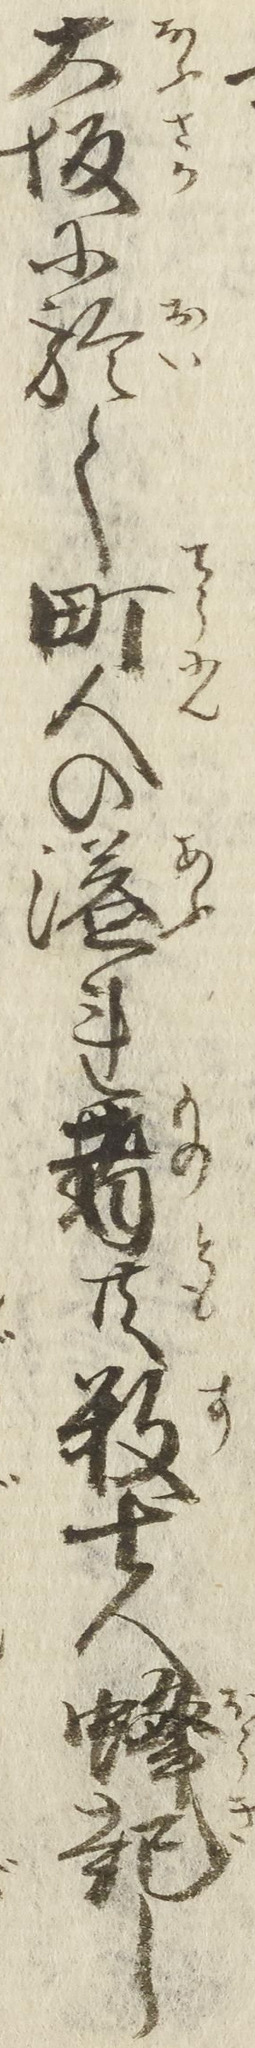大坂に於て町人の溢れ者共数十人蜂起し
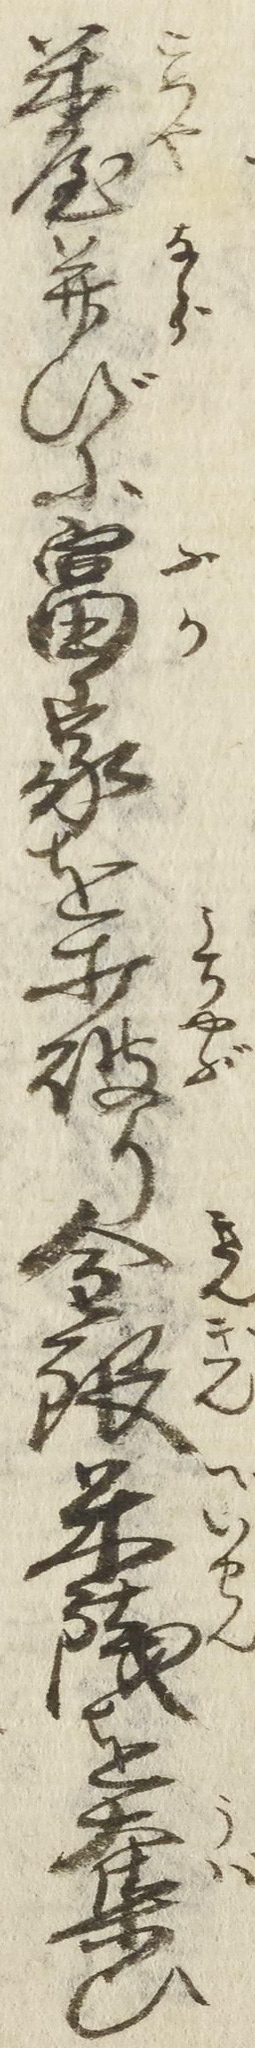米屋幷びに富家を打破り金銀米銭を奪ひ
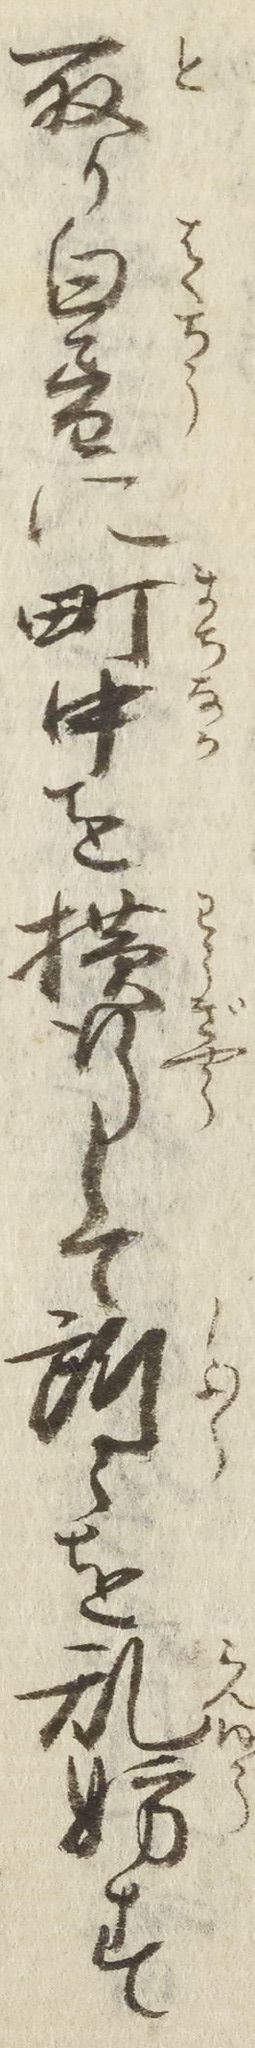取り白昼に町中を横行して所〻を乱妨す
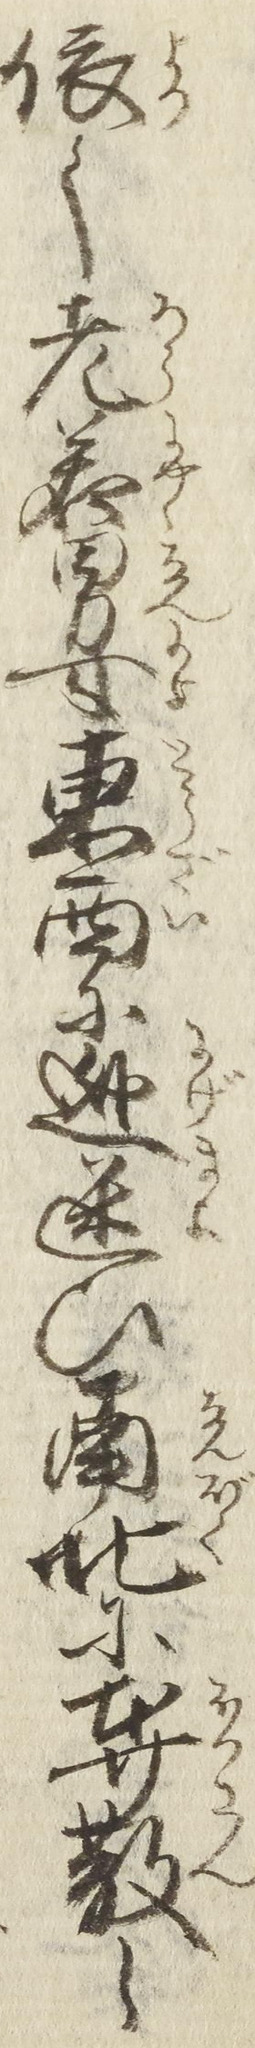依て老若男女東西に逃迷ひ南北に奔散し
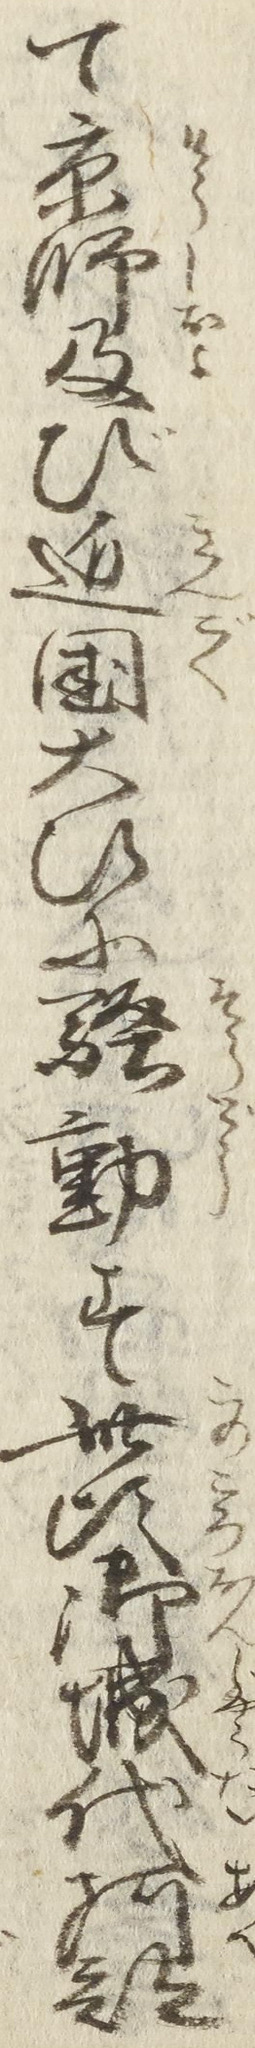て京師及び近国大ひに騒動す此頃御城代阿部
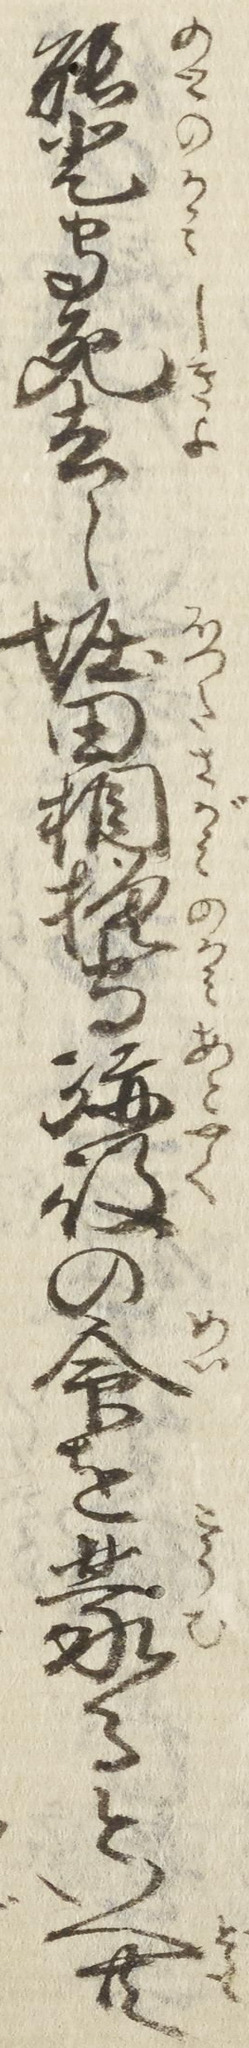能登守死去し堀田相模守跡役の命を蒙るといへ共
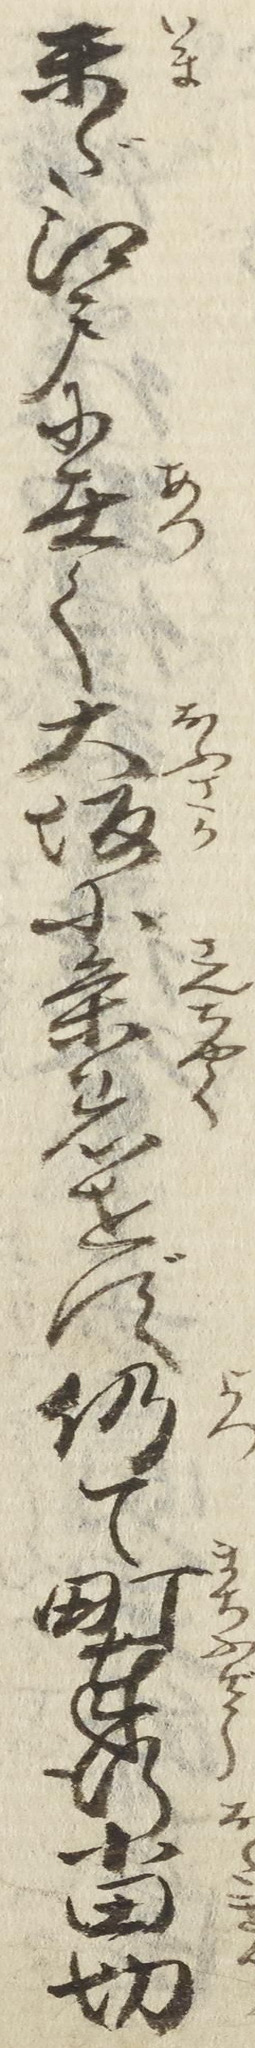未だ江戸に在て大坂に参着せず仍て町奉行小田切

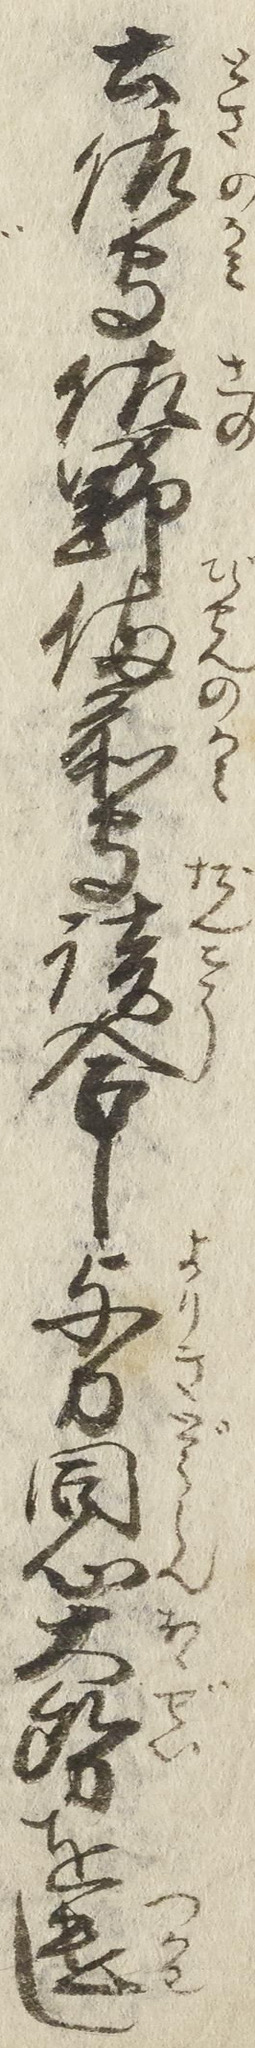土佐守佐野備前守談合し与力同心大勢を遣し
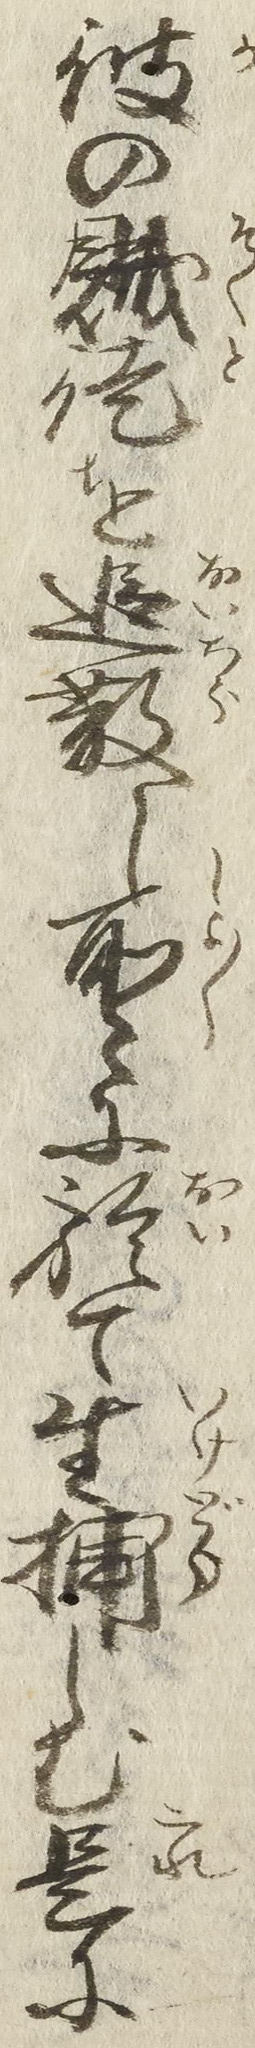彼の賊徒を追散し所〻に於て生捕しむ是に
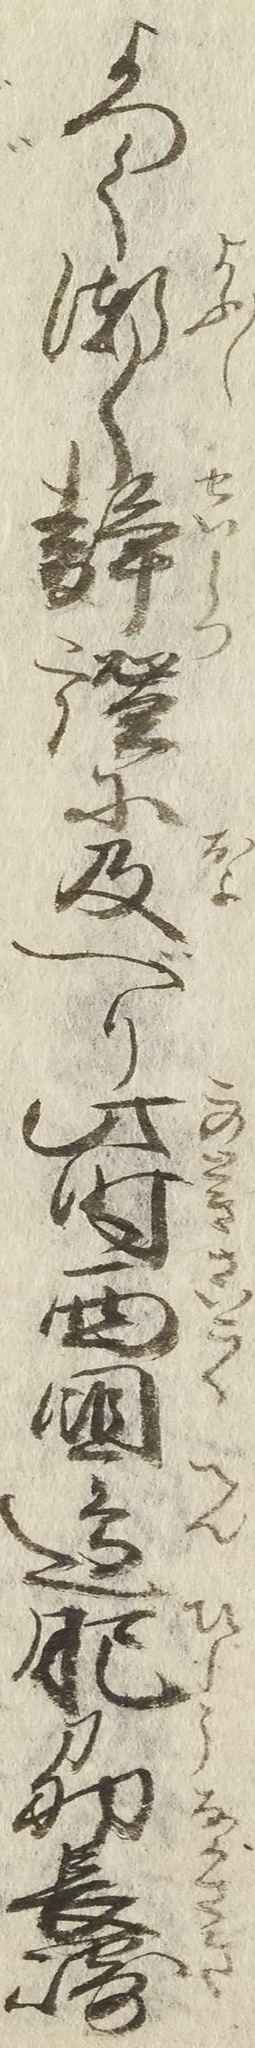よつて漸〻静謐に及べり此時西国辺肥州長崎
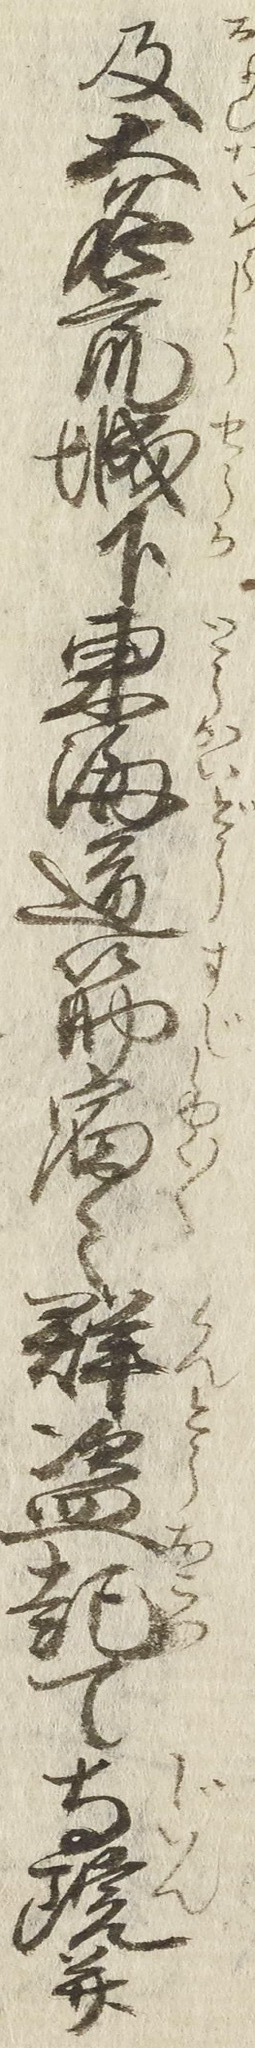及大名衆城下東海道筋宿〻群盗起て寺院并
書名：天明奇畧　全
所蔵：東京大学地震研究所図書室 Earthquake Research Institute Library, The University of Tokyo, JAPAN
